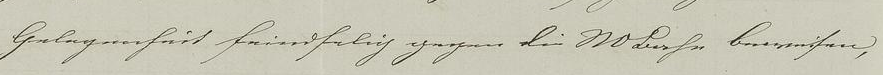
Gelegenheit feindselig gegen die NOBahn beweisen,
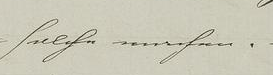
solche machen.
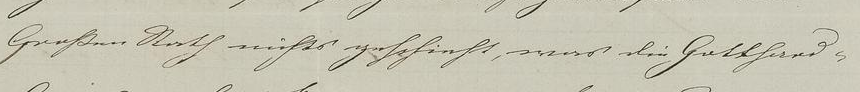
Großen Rath nichts geschieht, was die Gotthard-
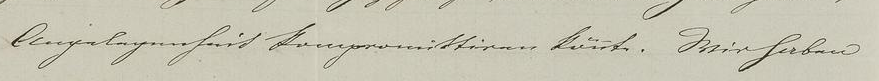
Angelegenheit kompromittiren könnte. Wir haben
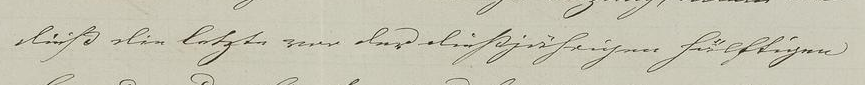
dieß die letzte vor der dießjährigen hälftigen
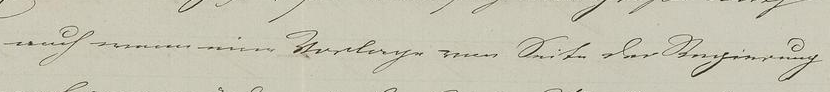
auch wenn eine Vorlage von Seite der Regierung
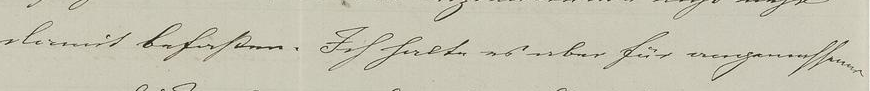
damit befaßen. Ich halte es aber für angemessener
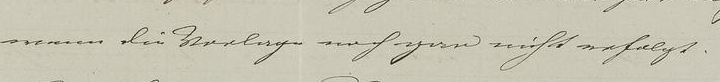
wenn die Vorlage noch gar nicht erfolgt.
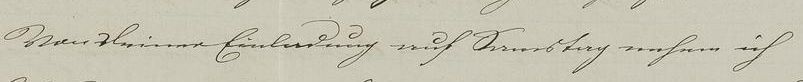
Von Deiner Einladung auf Samstag nehme ich
